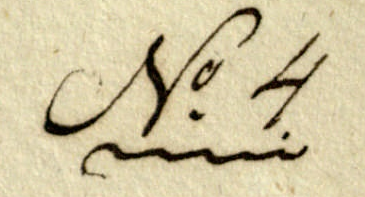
Nº 4.
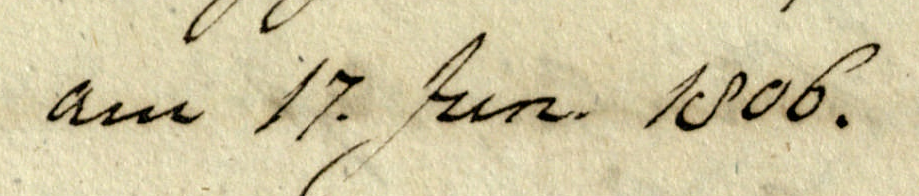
am 17. Jun. 1806.
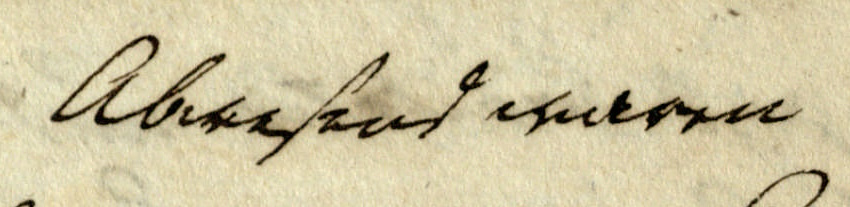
Abwesend waren
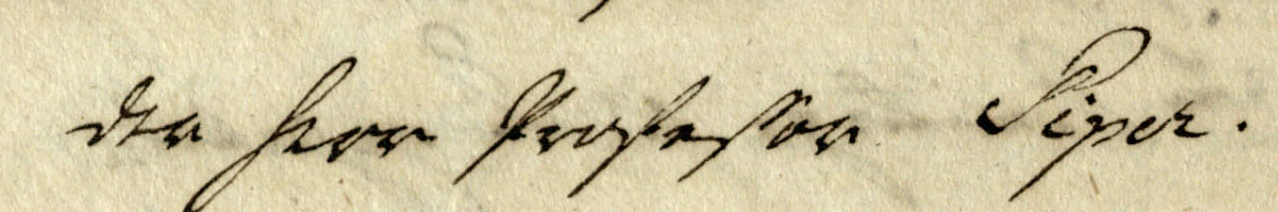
der herr Professor Piper.
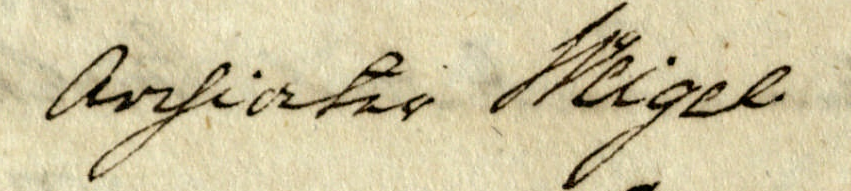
Archiater Weigel
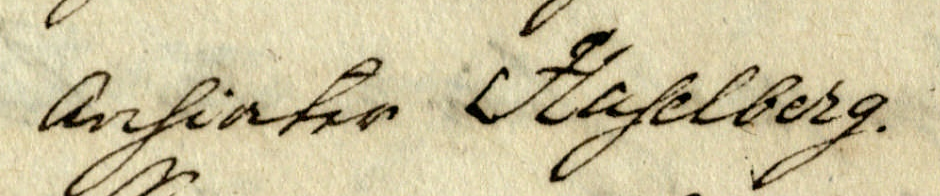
Archiater Haselberg.
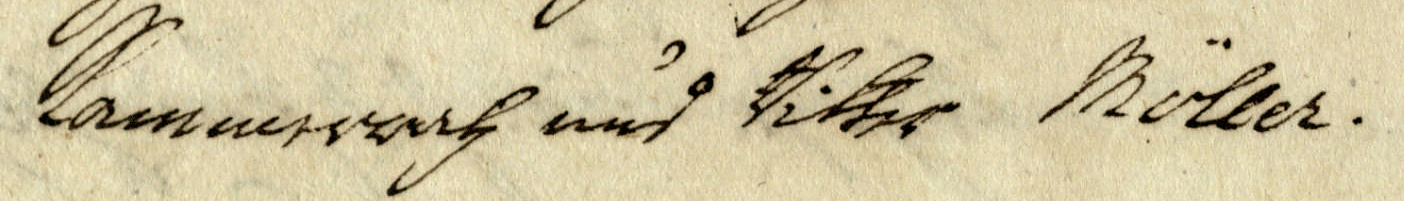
Kammerrath und Ritter Möller.
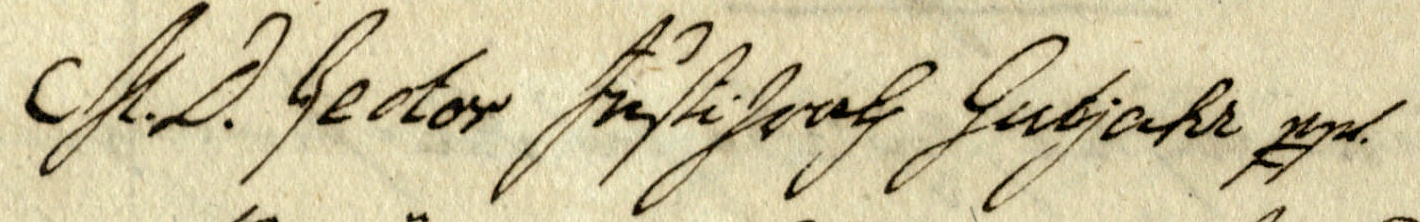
M. D. Rector Justizrath Gutjahr ppt.
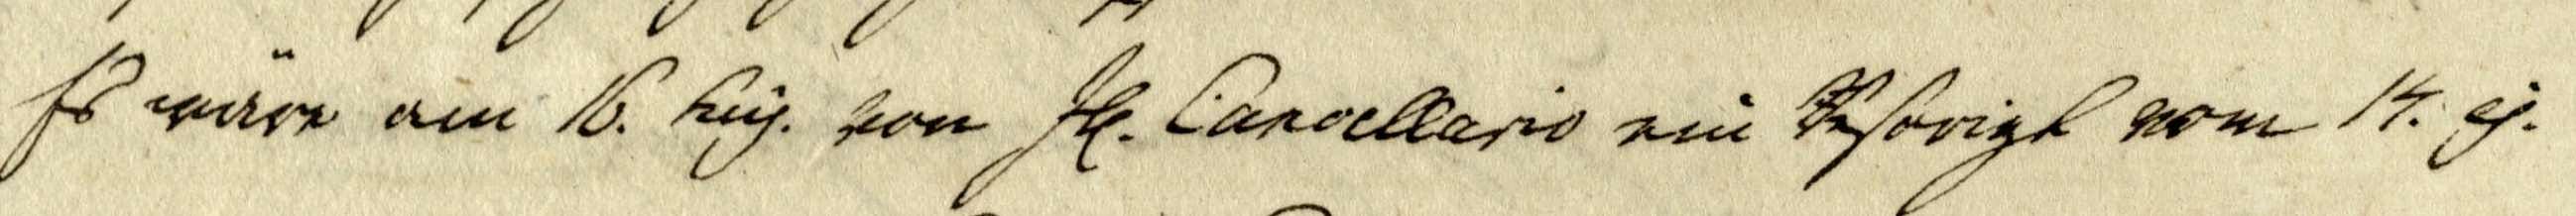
Es wäre am 16. huj. von Ill. Cancellario ein Rescript vom 14. ej.
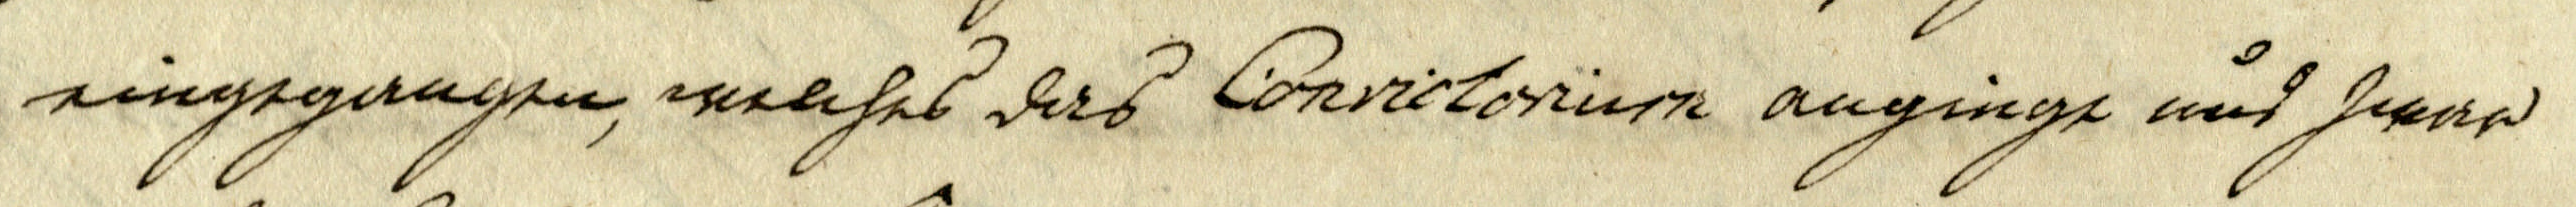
eingegangen, welches das Convictorium anginge und zwar
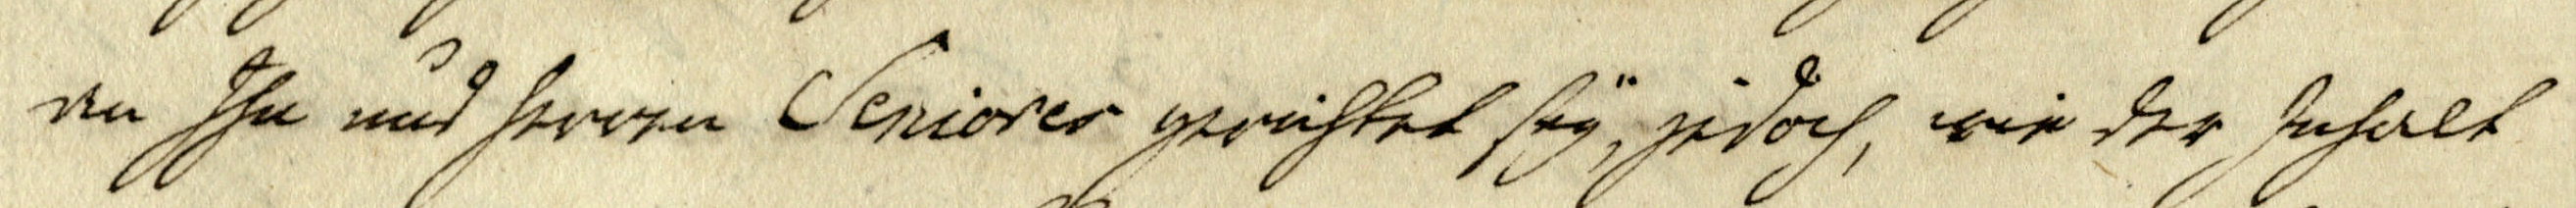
an Ihn und herren Seniores gerichtet seÿ, jedoch, wie der Inhalt
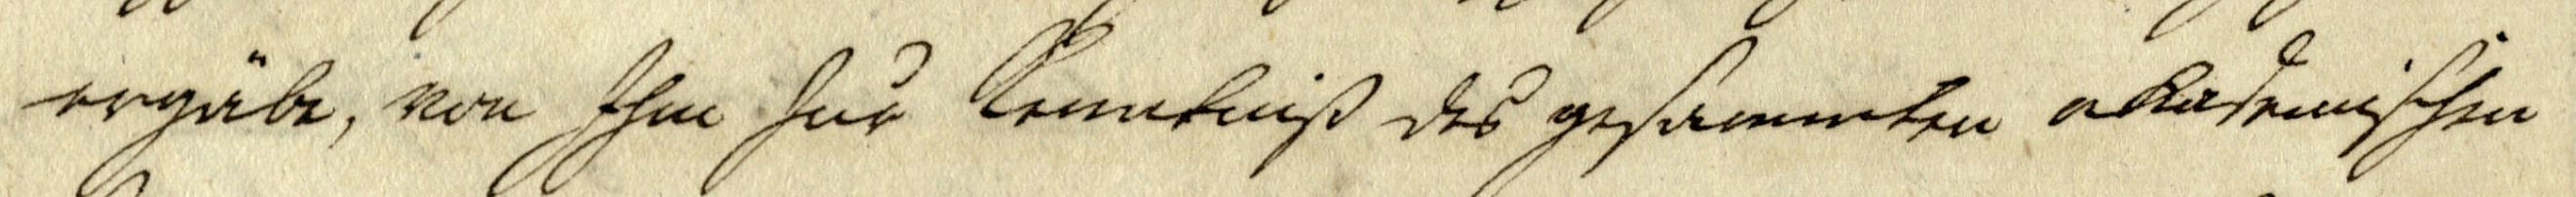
ergäbe, von Ihm zur Kenntniß des gesammten akademischen
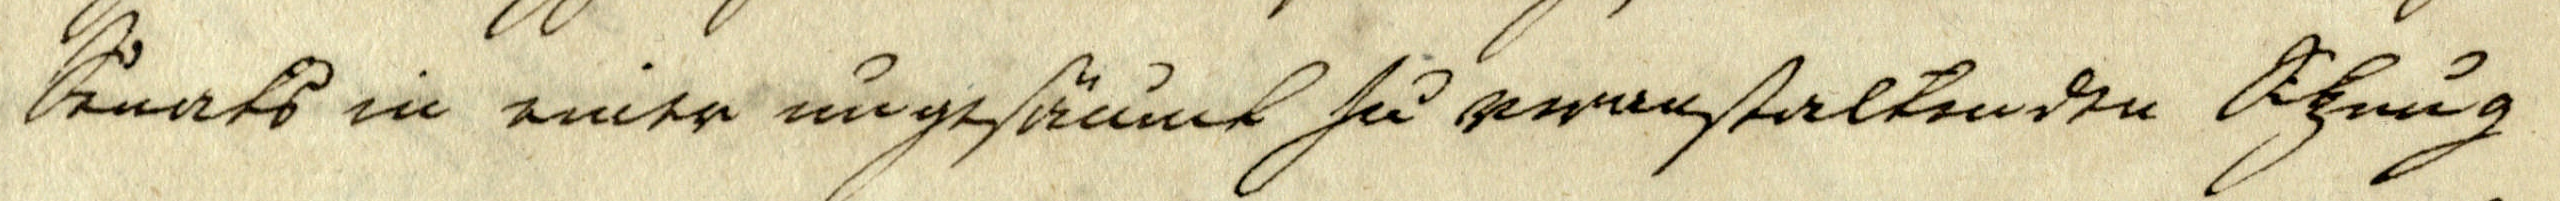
Senats in einer ungesäumt zu veranstaltenden Sitzung
